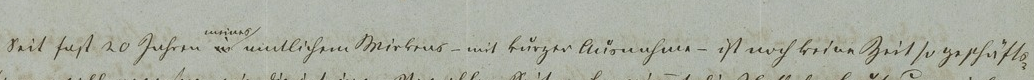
Seit fast 20 Jahren inmeines amtlichen Wirkens – mit kurzer Ausnahme – ist noch keine Zeit so geschäfts-
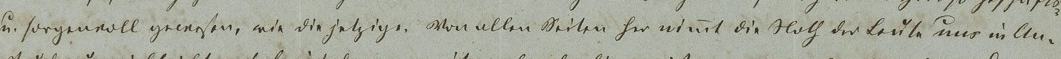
u. sorgenvoll gewesen, wie die jetzige. Von allen Seiten her nimmt die Noth der Leute uns in An-
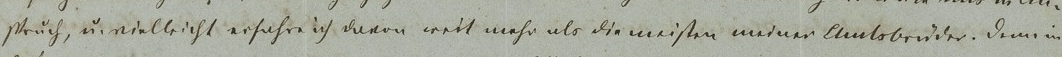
spruch, u. vielleicht erfahre ich davon weit mehr als die meisten meiner Amtsbrüder. Denn in
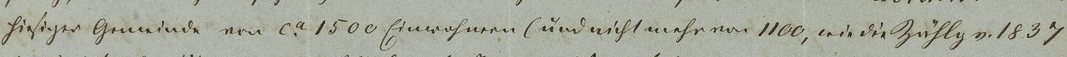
hiesiger Gemeinde von ca 1500 Einwohnern (und nicht mehr von 1100, wie die Zählg v. 1837
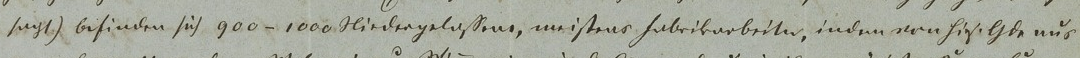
sagt) befinden sich 900–1000 Niedergelassene, meistens Fabrikarbeiter, indem von hies. Gde aus
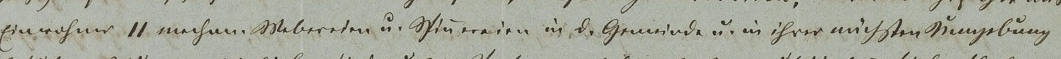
Einwohner 11 mechan. Webereien u. Spinnereien in d. Gemeinde u. in ihrer nächsten Umgebung
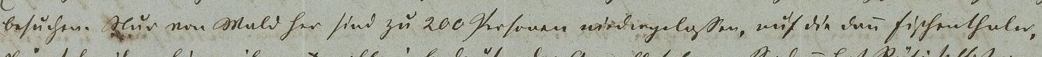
besuchen. Nur von Wald her sind zu 200 Personen niedergelassen, auf die dann Fischenthaler,
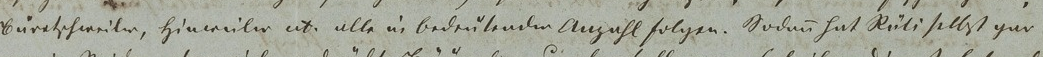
Bäretschweiler, Hinweiler ect. alle in bedeutender Anzahl folgen. Sodann hat Rüti selbst gar
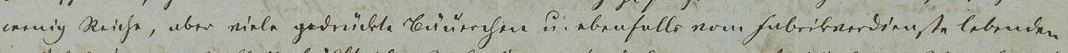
wenig Reiche, aber viele gedrückte Bäuerchen u. ebenfalls vom Fabrikverdienste lebenden
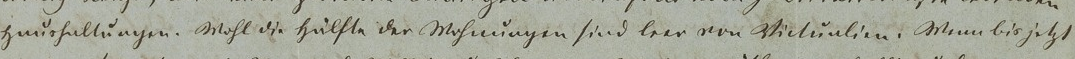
Haushaltungen. Wohl die Hälfte der Wohnungen sind leer von Victualien. Wenn bis jetzt
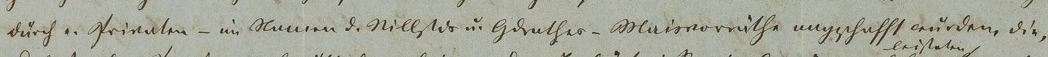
durch e. Privaten – im Namen d. Stillstds u. Gdrathes – Maisvorräthe angeschafft wurden, die,
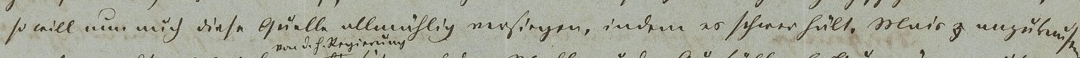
so will nun auch diese Quelle allmählig versiegen, indem es schwer hält, Mais z anzukaufen.
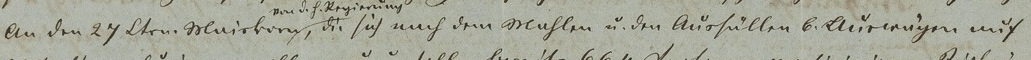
von d. h. Regierung, die sich nach dem Mahlen u. den Ausfällen b. Auswägen auf
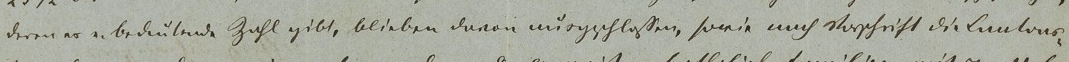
deren es e. bedeutende Zahl gibt, blieben davon ausgeschlossen, sowie nach Vorschrift die Cantons-
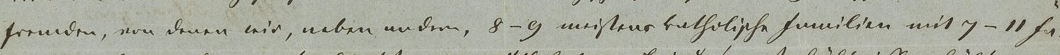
fremden, von denen wir, neben andern, 8–9 meistens katholische Familien mit 7–11 Fa-
